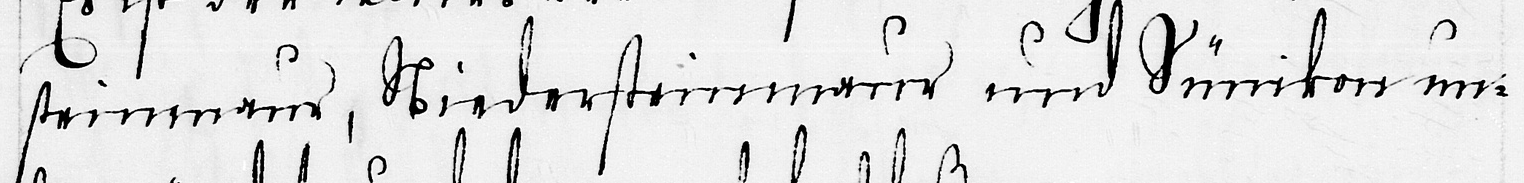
steinmaur, Niedersteinmaur und Sünikon un¬
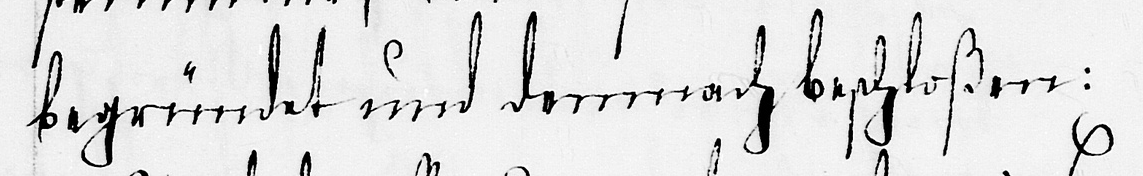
begründet und demnach beschloßen:
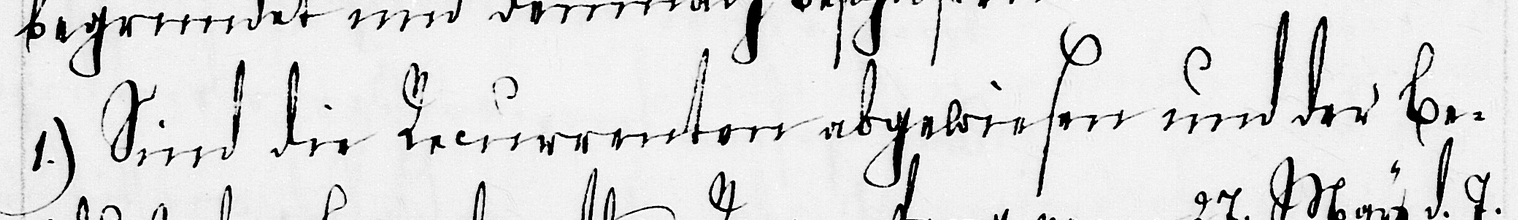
1.) Sind die Recurrenten abgewiesen und der Be¬
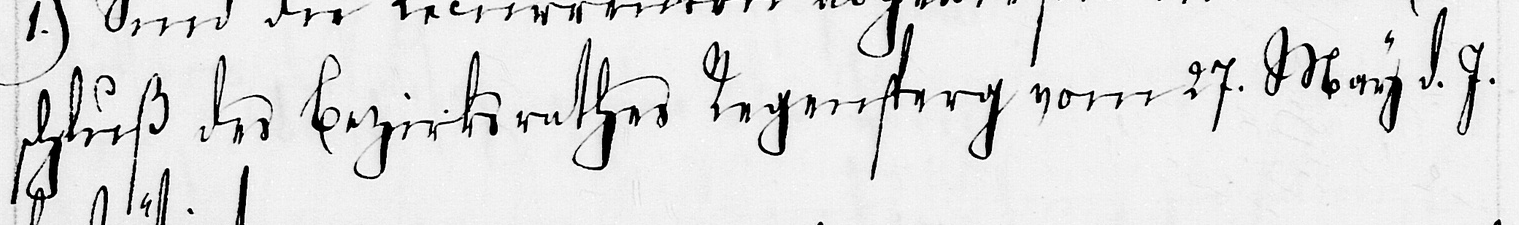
schluß des Bezirksrathes Regensperg vom 27. May d. J.
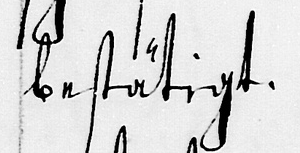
bestätigt.
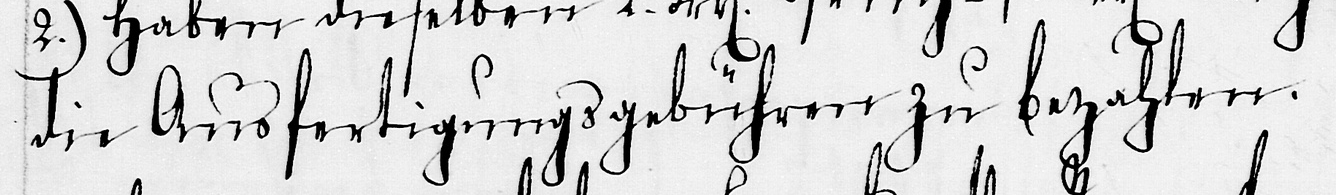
die Ausfertigungsgebühren zu bezahlen.
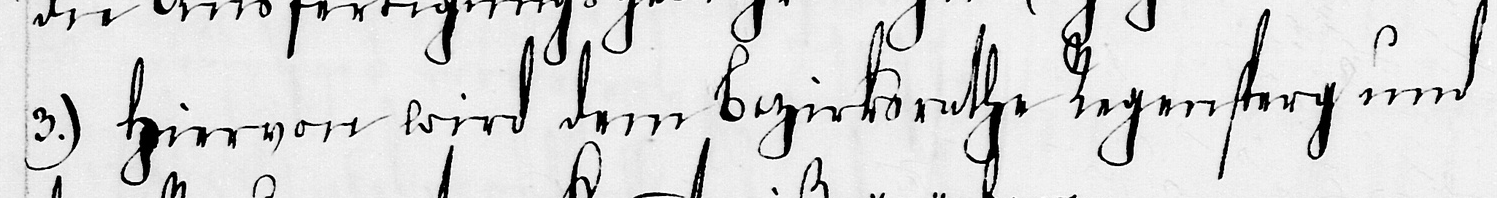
2.) Hiervon wird dem Bezirksrathe Regensperg und
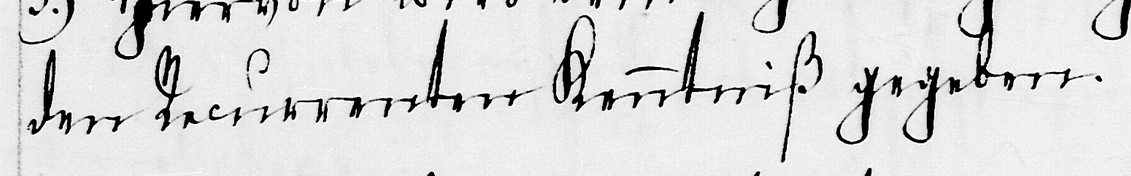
den Recurrenten Kenntniß gegeben.
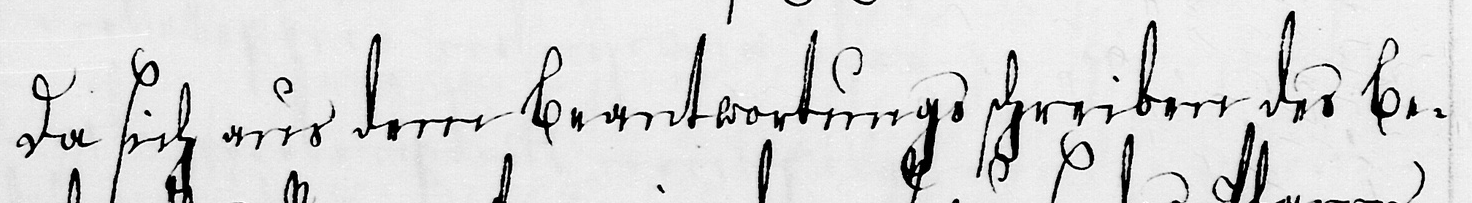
Da sich aus dem Beantwortungsschreiben des Be¬
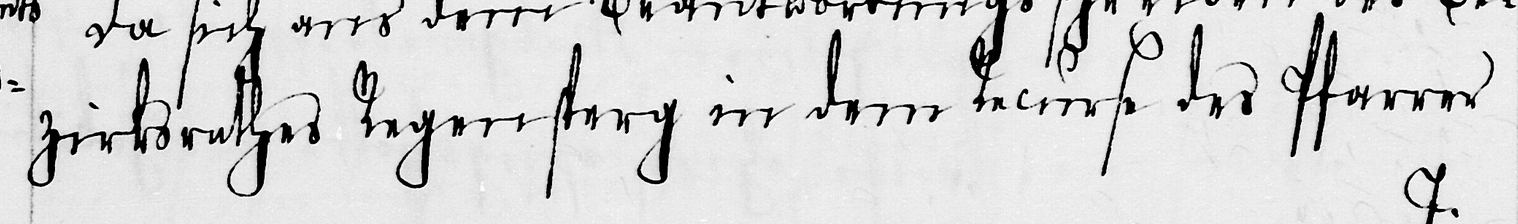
zirksrathes Regensperg in dem Recurse des Pfarrer
